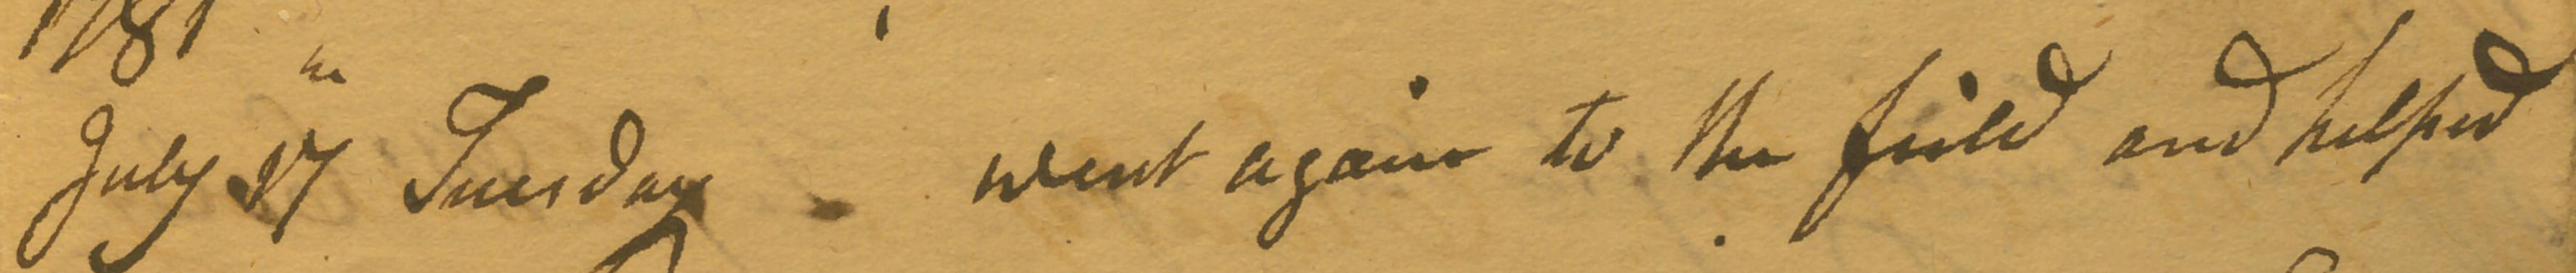July 17^th Tuesday went again to the field and helped
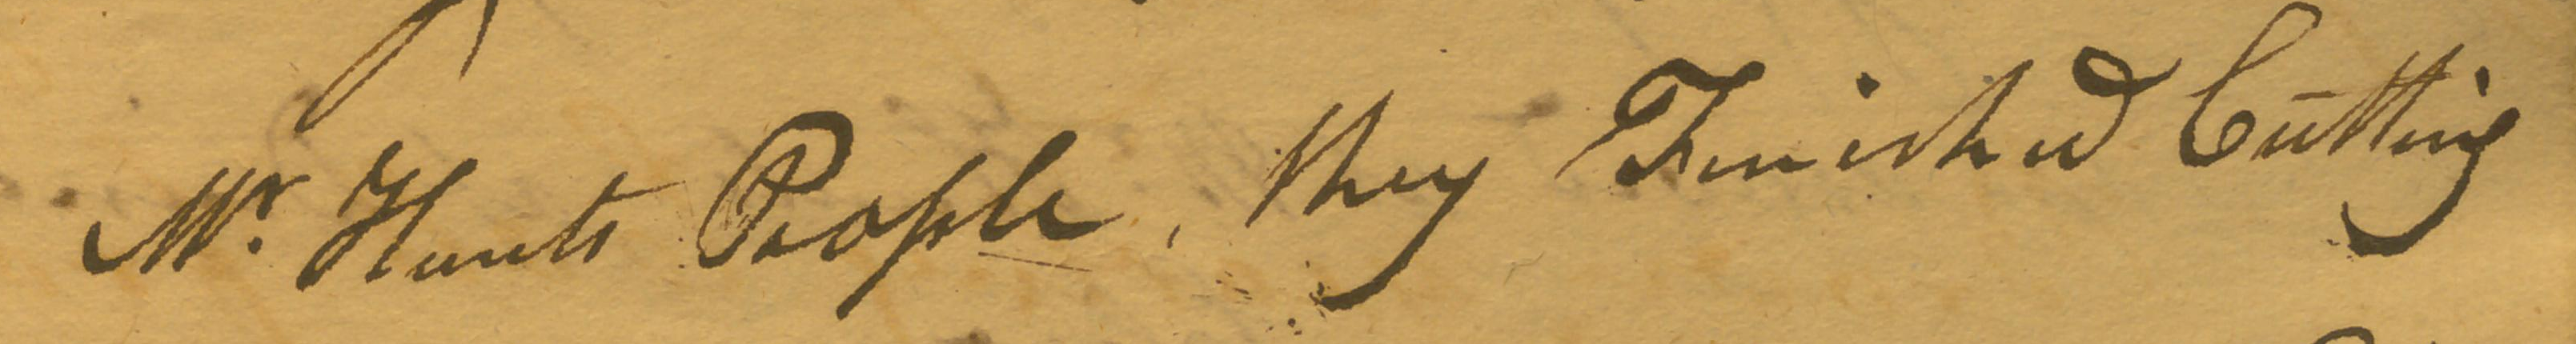M^r. Hunts People, they Finished Cutting
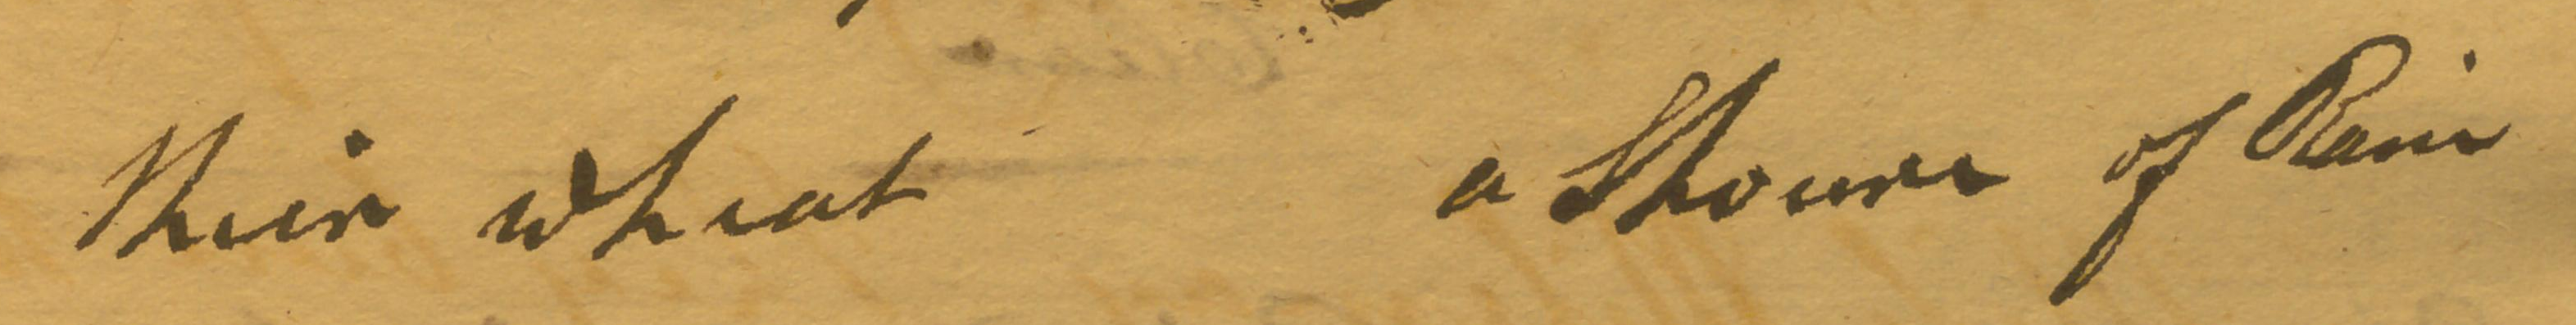their wheat a Shoure of Rain
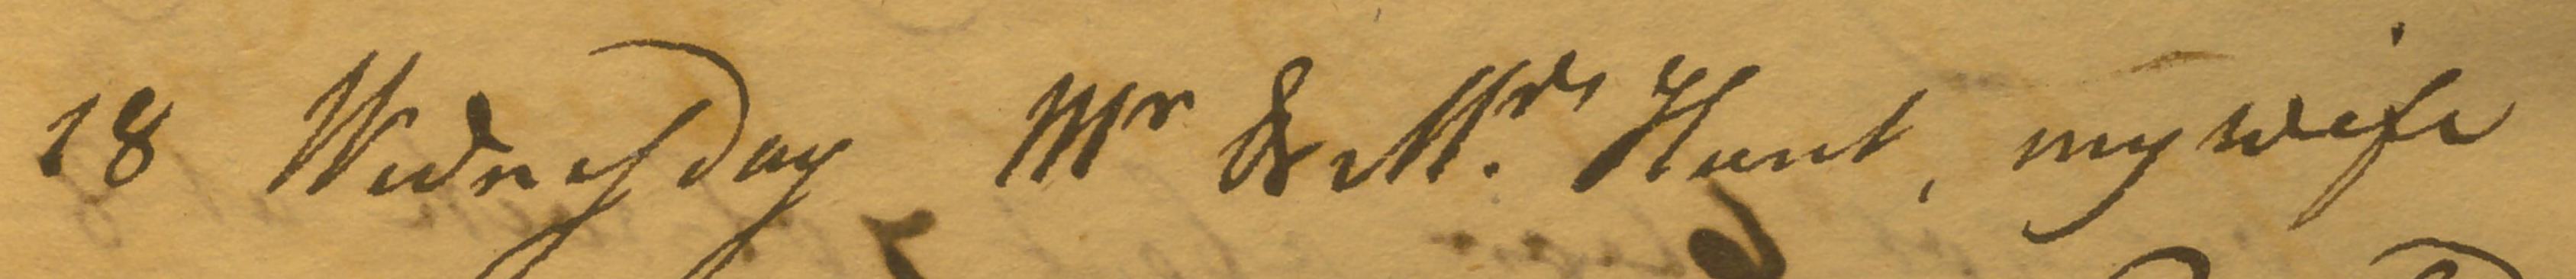18 Wednesday M^r. & M^rs. Hunt my wife
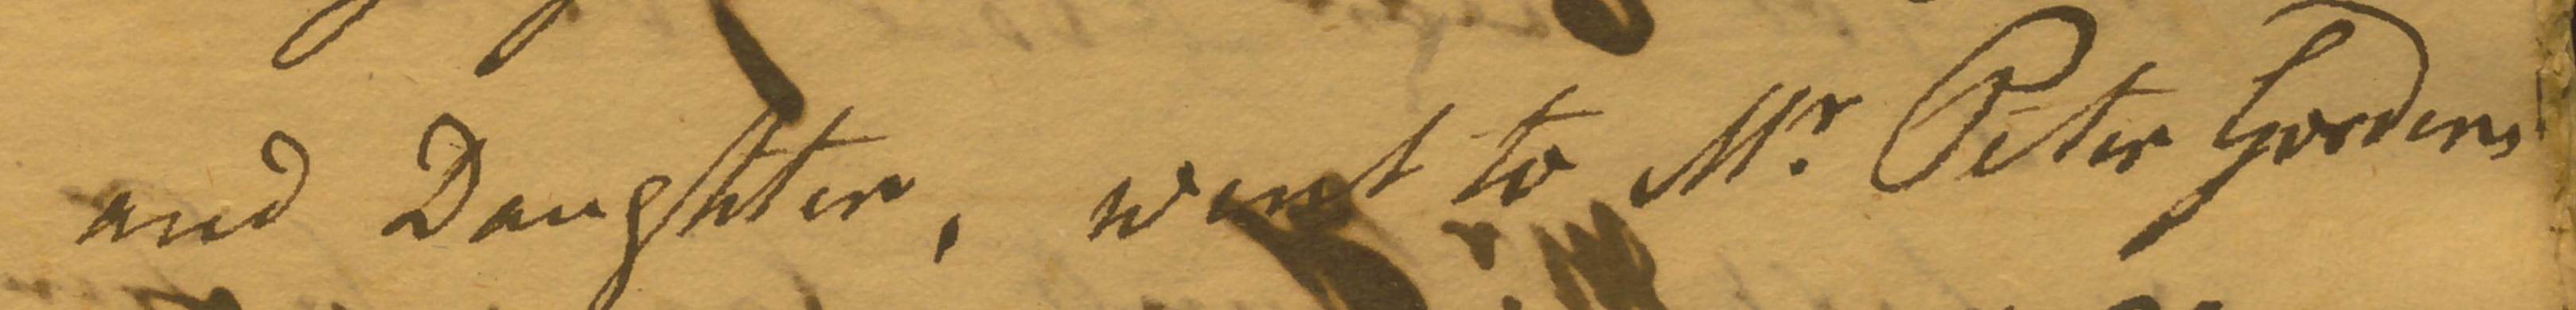and Daughter, went to M^r. Peter Gordens
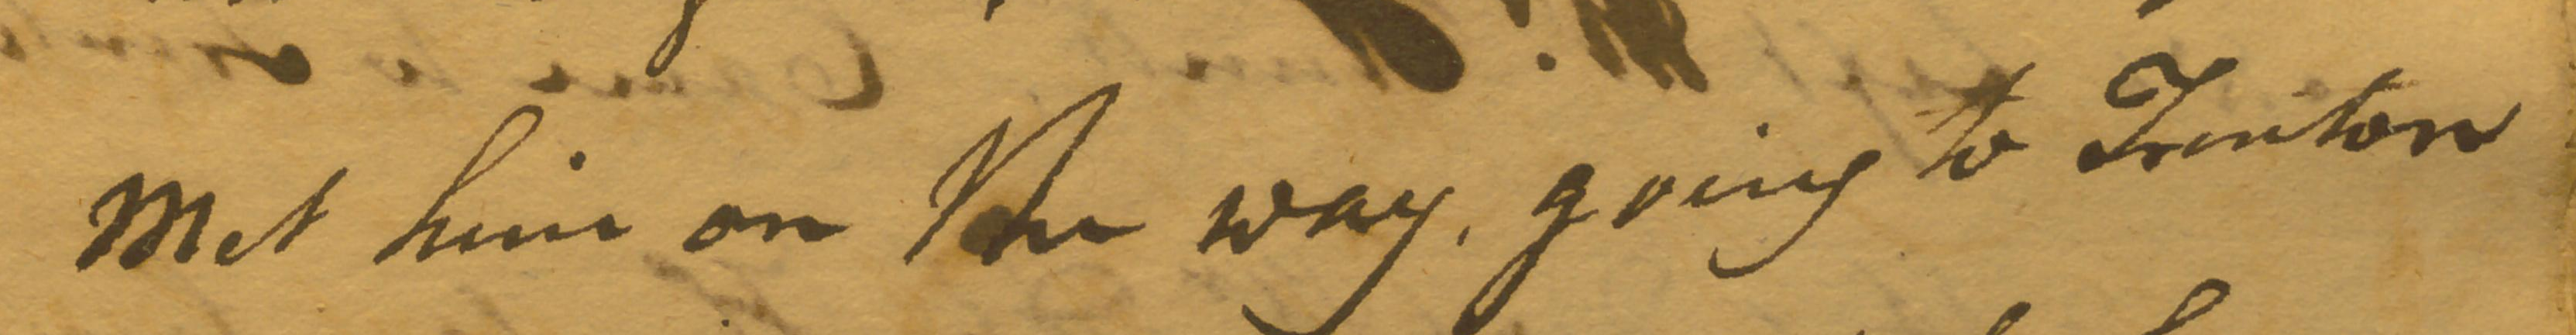Met him on the way, going to Trenton
